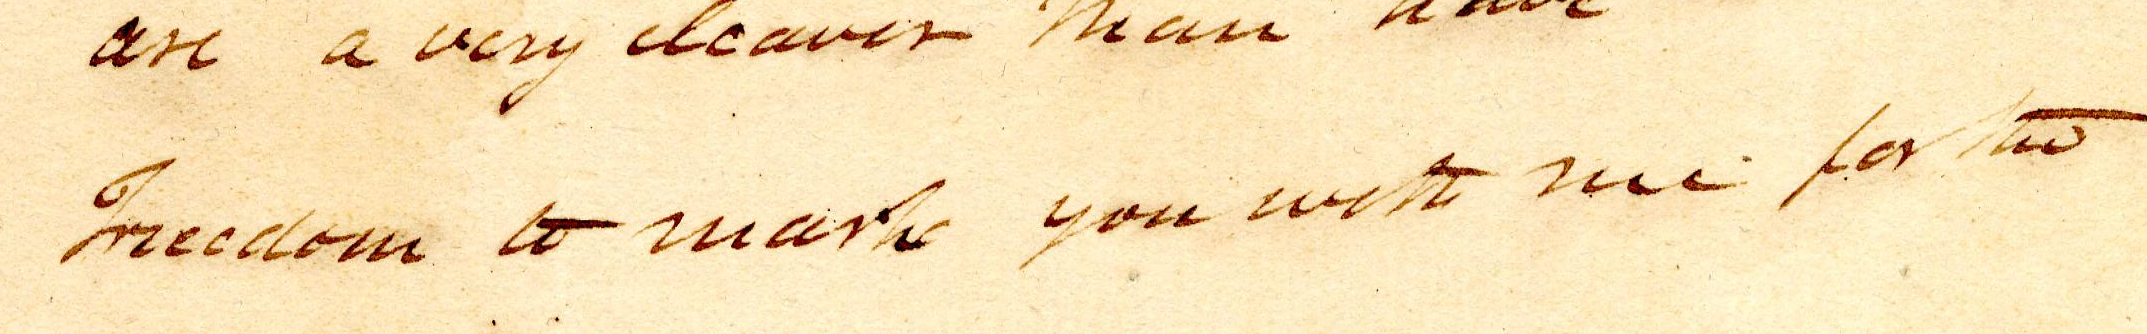Freedom to mark you with me for the
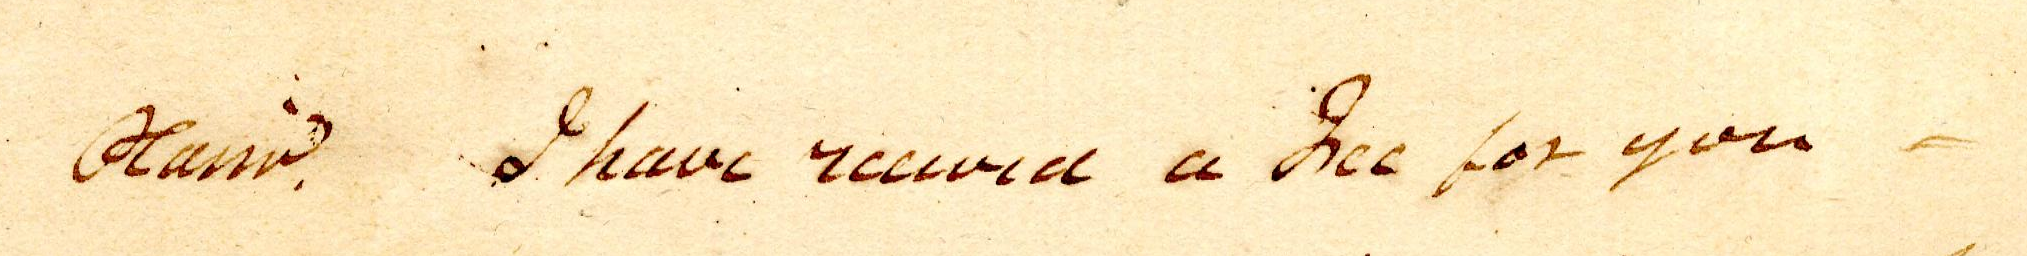Plan. I have receved a fee for you
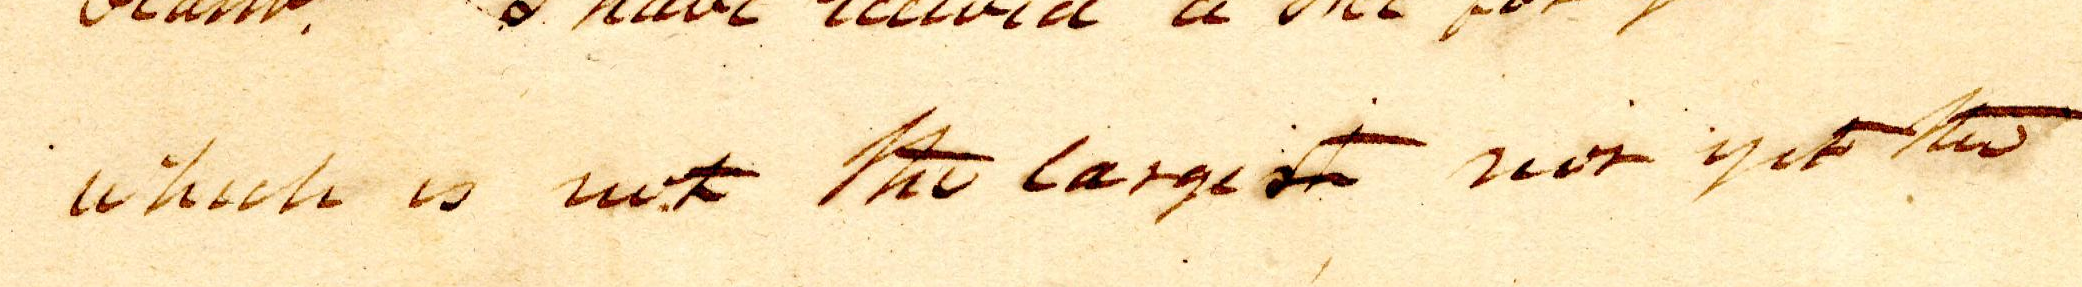which is not the largest nor yet the
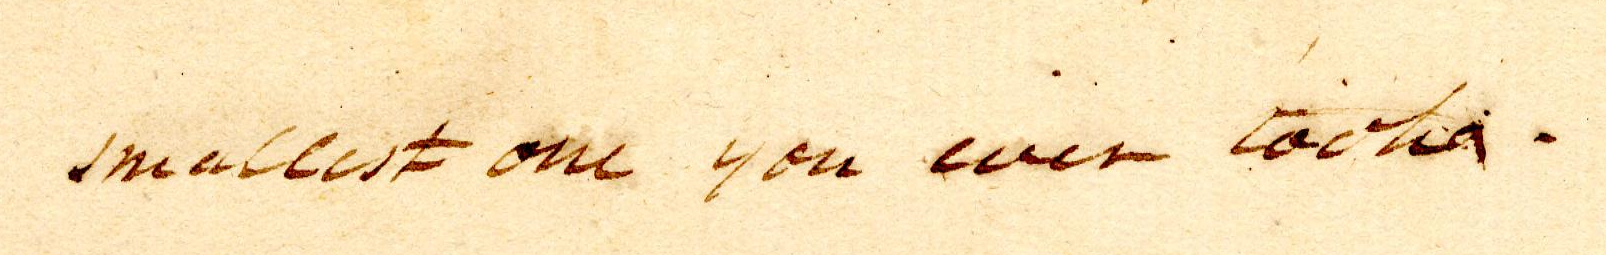smallest one you ever took.
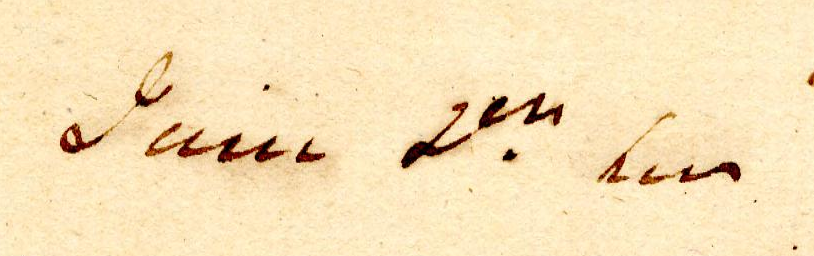I am D^r Sir
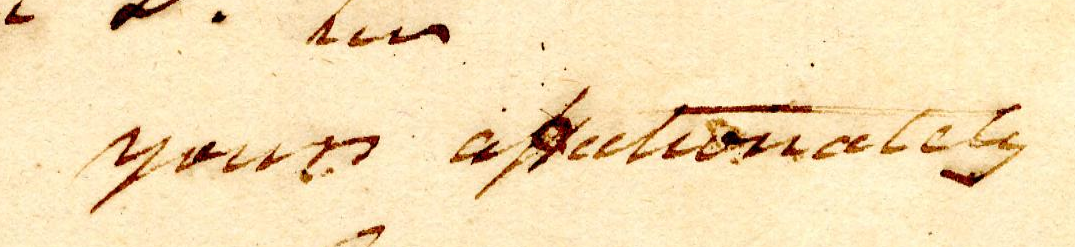yours affectionately
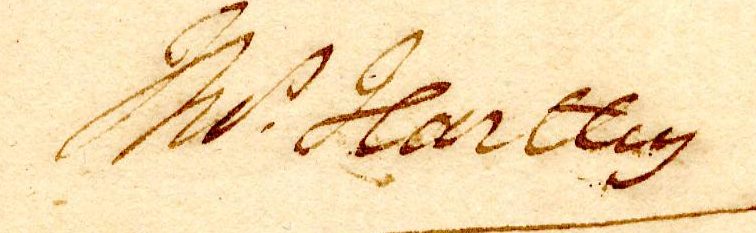Tho^s. Hartley
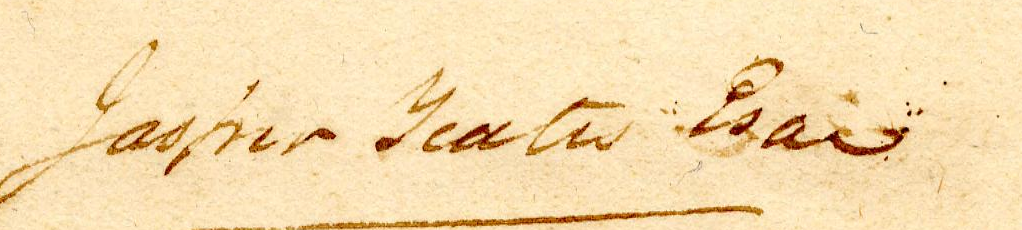Jasper Yeates Esq
